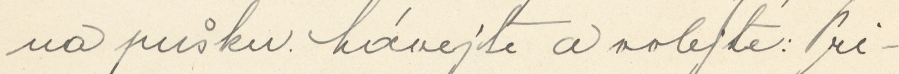na pušku. Mávejte a volejte: Pri-
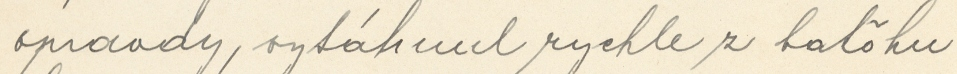opravdy, vytáhnul rychle z baťohu
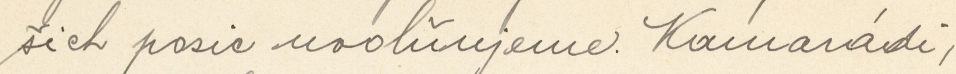šich posic uvolňujeme. Kamarádi,
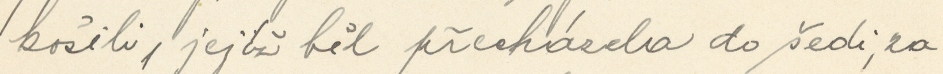košili, jejíž běl přecházela do šedi, za-
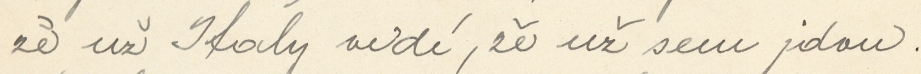že už Italy vidí, že už sem jdou.
